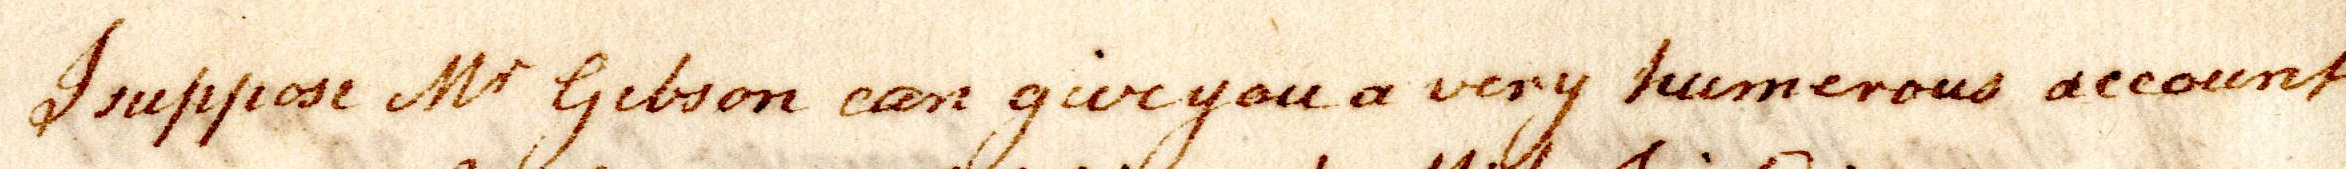I suppose M^r Gibson can give you a very humerous account
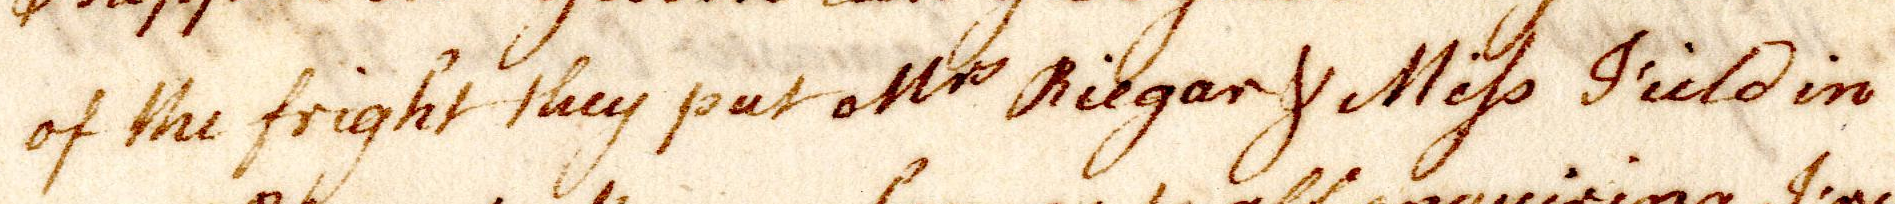of the fright they put M^rs. Riegar & Miss Field in
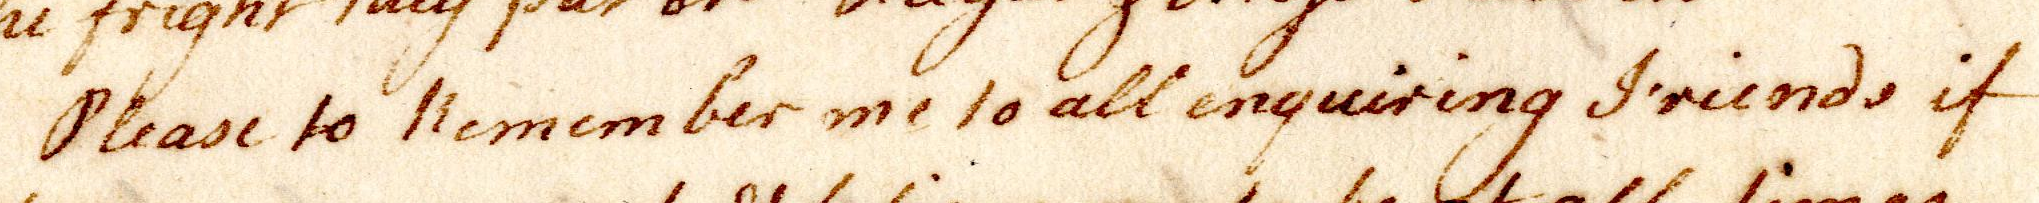Please to Remember me so all enquiring friends if
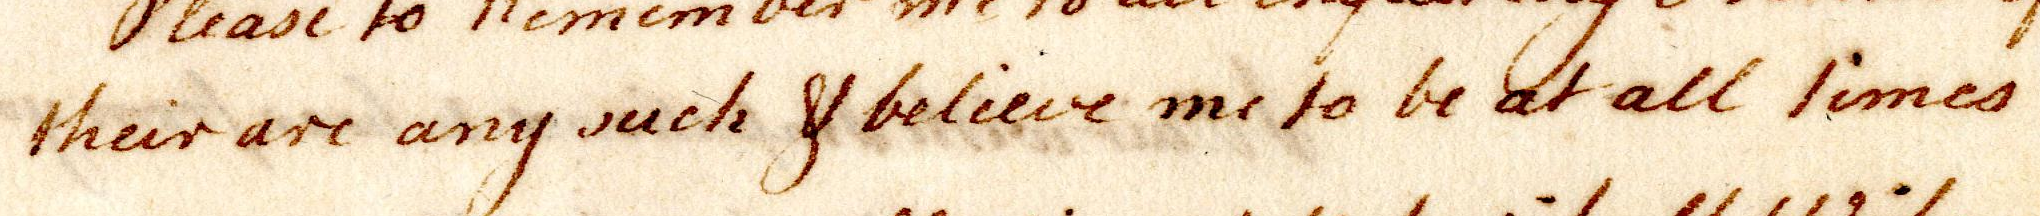their are any such & believe me to be at all times
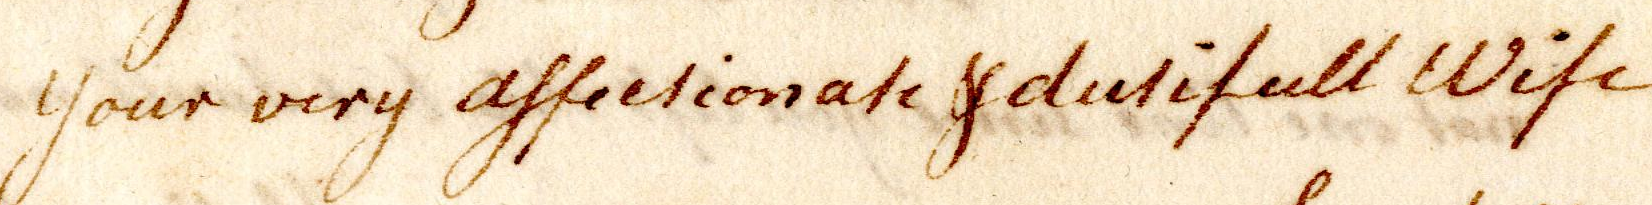Your very affectionate & dutifull Wife
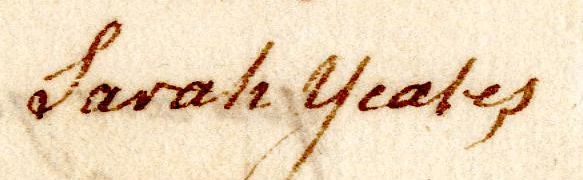Sarah Yeates
